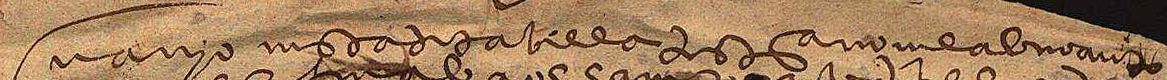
naryo nesta dita villa testa nomeado no auto
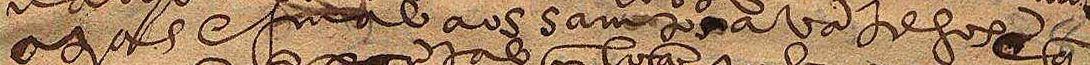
atras e Jurado aos samtos avāJelhos ē q̄
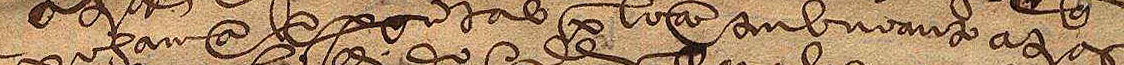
pos sua mā e ꝑgūtado p̄lo cōteudo no auto atras
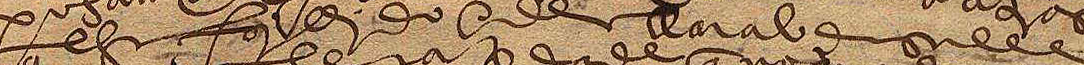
q̄ lhe foy lljdo e decllarado dise elle
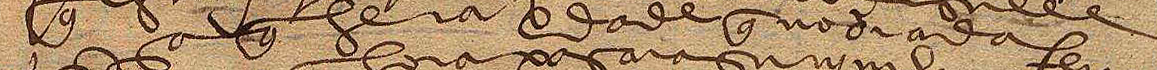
testa q̄ hera ꝟdade q̄ no dia da feira
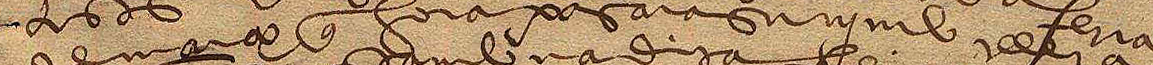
de março q̄ hora pasara serujndo elle ta
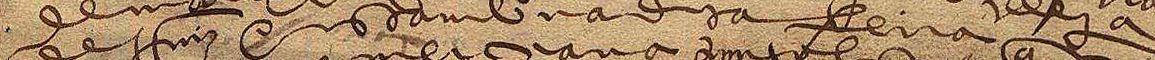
de Juiz e estando na dita feira q̄ se
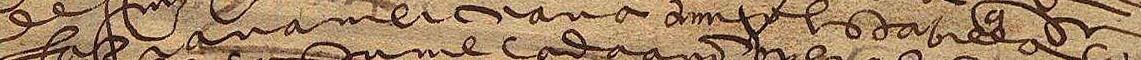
fazia na merceana termo desta villa co
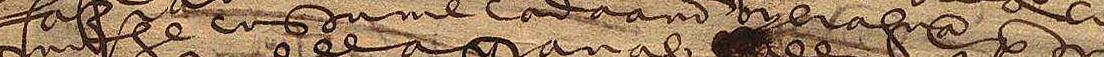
mo he custume cada anō vyera huā p̄te
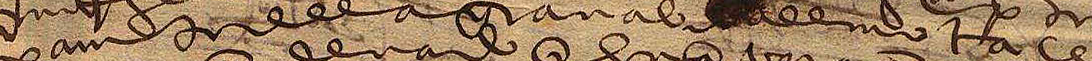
ꝑamte elle agrauado do allmotace
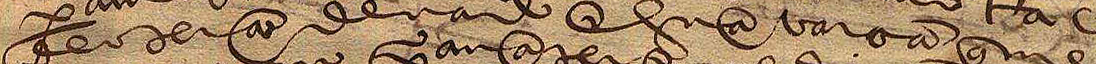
de o ter c̄odenado ē huā vara cō q̄ me
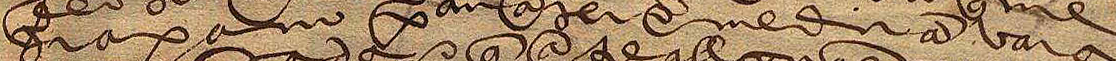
dia pano p̄o a nā ter e medir cō vara
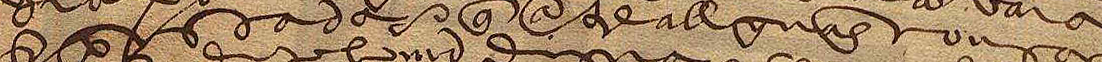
ēp̄estada e q̄ ātre allguās cousas
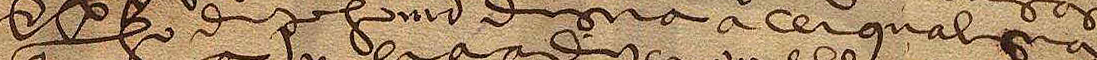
o dito homē disera acerqua de sua
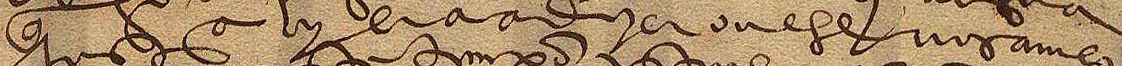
Justa vyera a dizer oulhe uosa mer
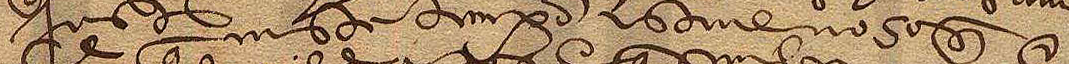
ce q̄ neste tempo esteue noso s̄r ē
